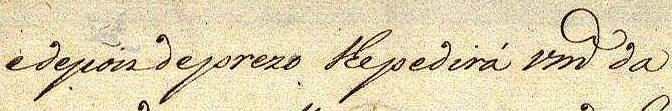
e depois de prezo lhe pedirá v m.e da
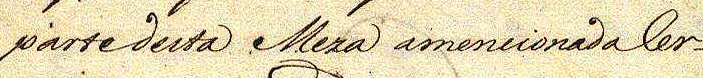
parte desta Meza a mencionada Cer
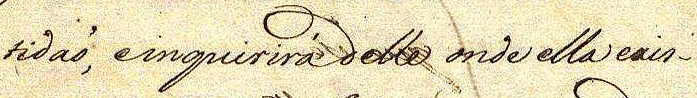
tidaõ, e inquirirá delle onde ella exis
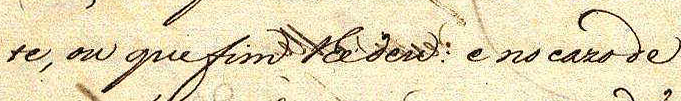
te, ou que fim lhe deu: e no cazo de
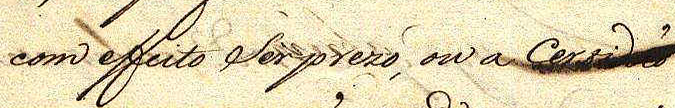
com effeito Ser prezo, ou a certid_õ
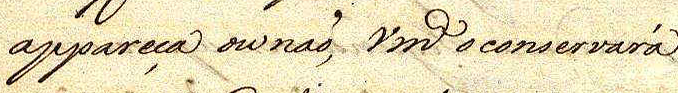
appareça ou naõ, v m.e o conservará
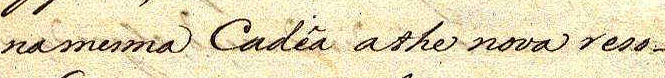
na mesma Cadêa athe nova reso
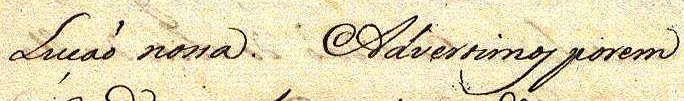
Luçaõ nossa. Advertimos porem
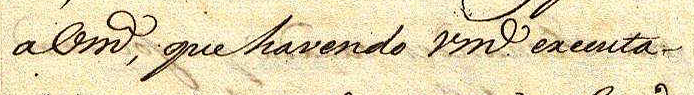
a v m.e, que havendo v m.e executa
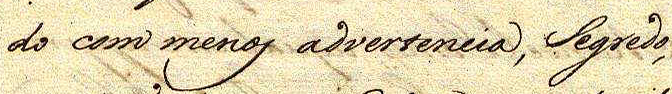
do com menos advertencia, Segredo,
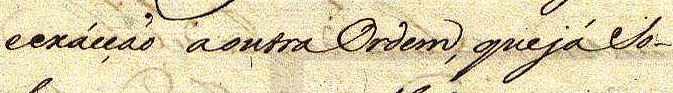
e exácçaõ a outra Ordem, que já So
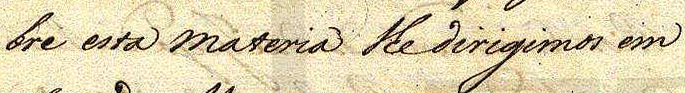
bre esta materia lhe dirigimos em
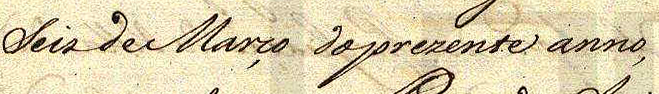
Seiz de Março do prezente anno,
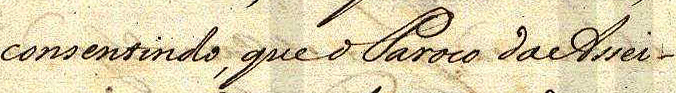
consentindo, que o Paroco da Assei
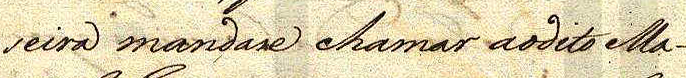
seira mandase chamar ao dito Ma
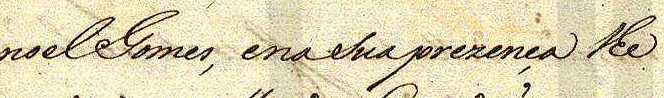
noel Gomes, e na sua prezença lhe
